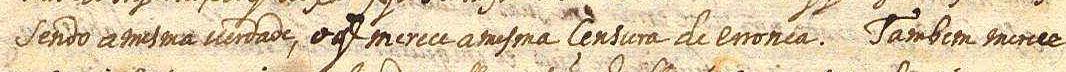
sendo a mesma uerdade, o q̄ merece a mesma Censura de erronea. Tambem merece
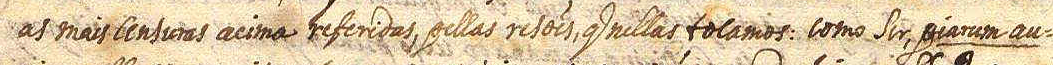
as mais censuras acima referidas, pellas resoẽs, q̄ nellas tocamos: como ser, piarum au
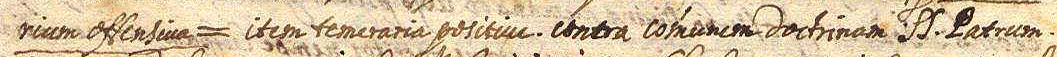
rium offensiua = item temeraria positiua. contra com̄unem doctrinam SS. Patrum
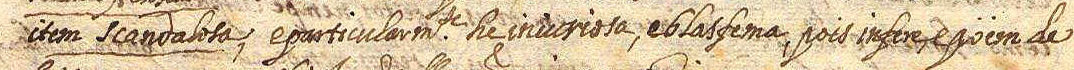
item scandalosa, e particularm.te he iniuriosa, e blasfema, pois infere, e poem de
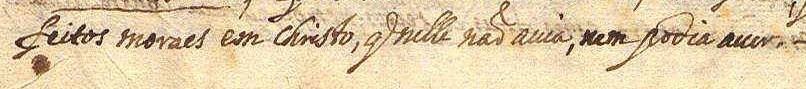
feitos moraes em christo, q̄ nelle naõ auia, nem podia auer.
